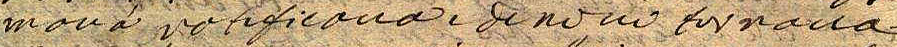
maua rateficaua e de nouo tornaua
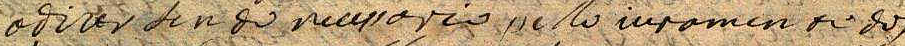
a dizer sendo necessario pello iuramento dos
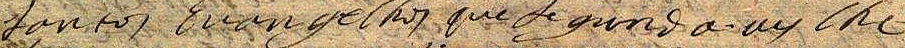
santos Euangelhos que segunda ues lhe
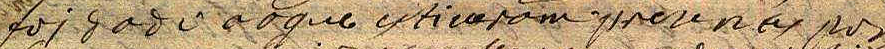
foi dado ao que estiueram prezentes por
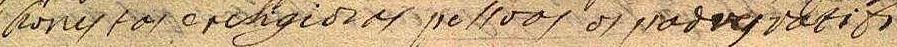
honestas e religiozas pessoas os padres ratifi
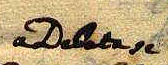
a Delata se
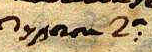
despozou 2a:
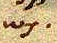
ues.
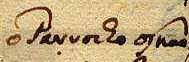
o Parrocho os naõ
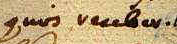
quis receber.
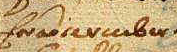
foraõse receber.
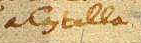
a Castella
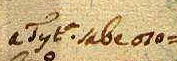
a Testa. sabe o so
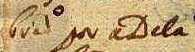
bredo por a Dela
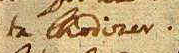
ta lho dizer.
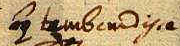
o q̄ tambem disse
